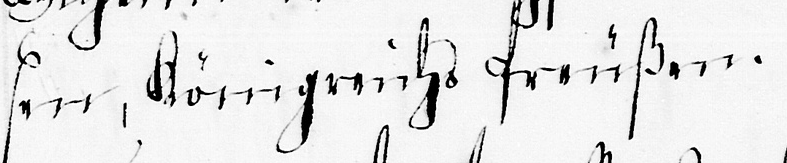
en, Königreichs Preußen.
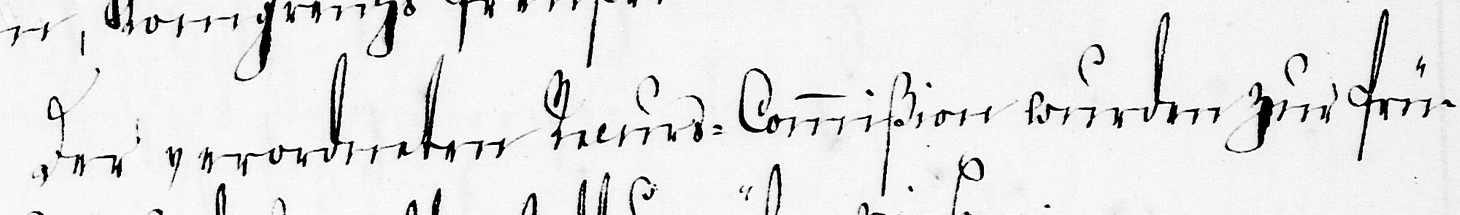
Der verordneten Recurs-Commißion wurden zur Prü¬
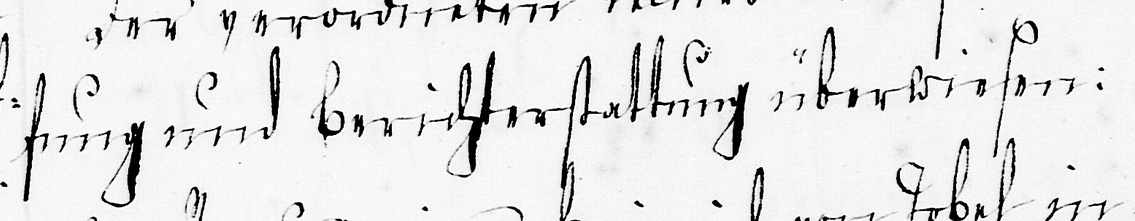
fung und Berichterstattung überwiesen:
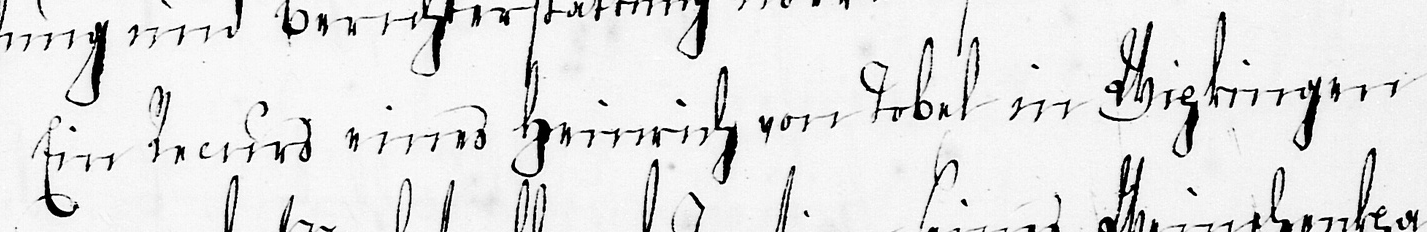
Ein Recurs eines Heinrich von Tobel in Wipkingen
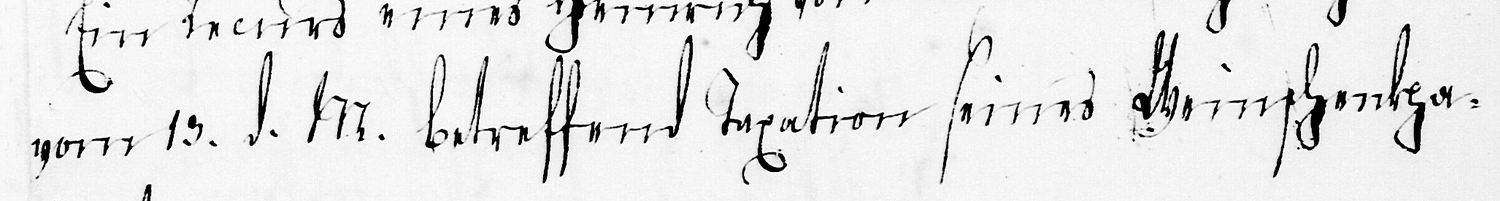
vom 13. d. M. betreffend Taxation seines Weinschenkpa¬
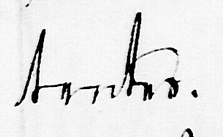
tentes.
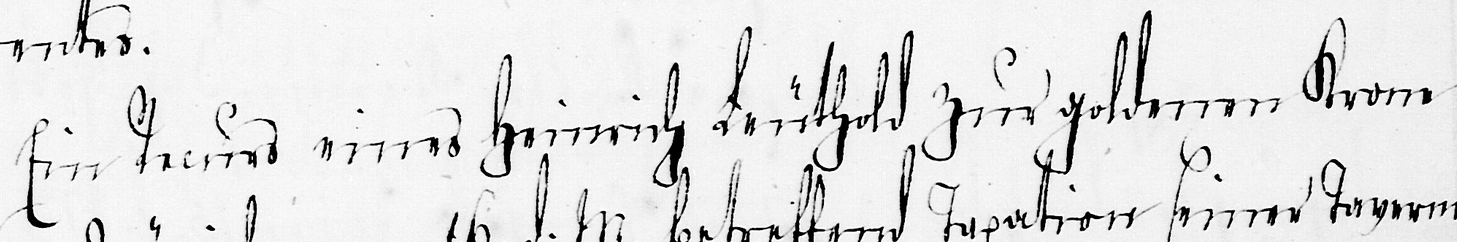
Ein Recurs eines Heinrich Leuthold zur goldenen Krone
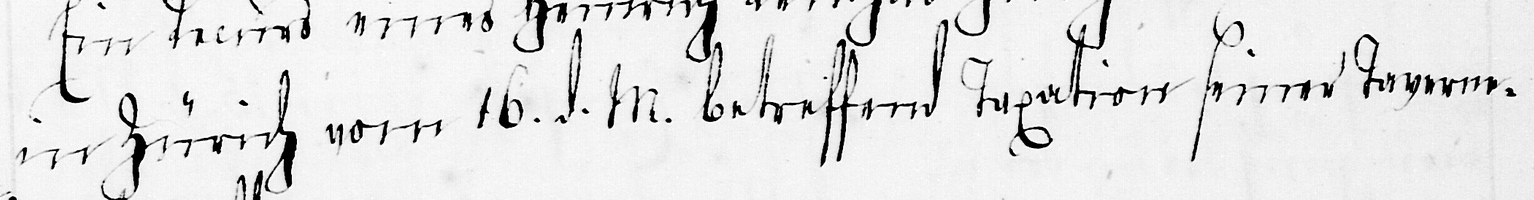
in Zürich vom 16. d. M. betreffend Taxation seiner Taverne¬
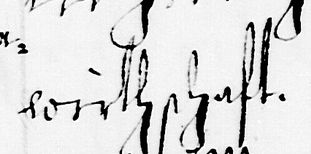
wirthschaft.
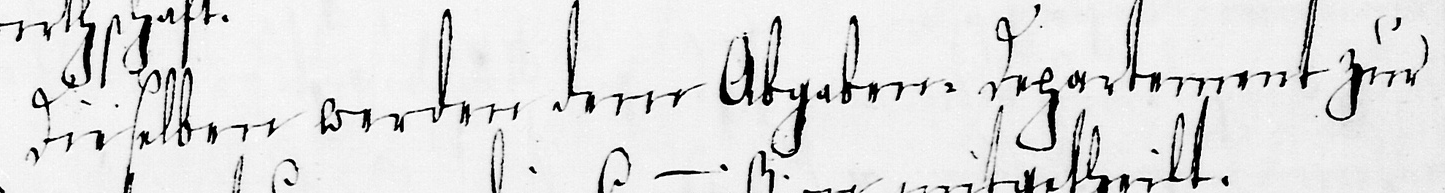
Dieselben werden dem Abgaben-Departement zur
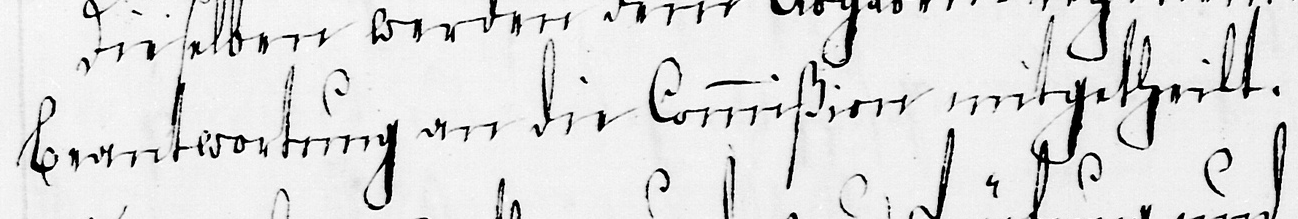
Beantwortung an die Commißion mitgetheilt.
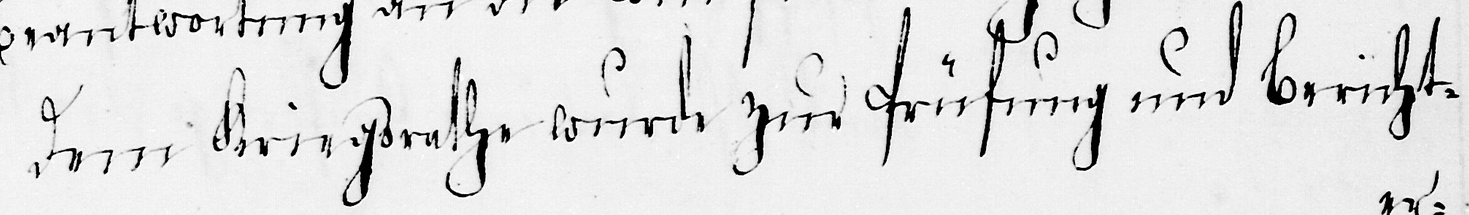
Dem Kriegsrathe wurde zur Prüfung und Bericht-
